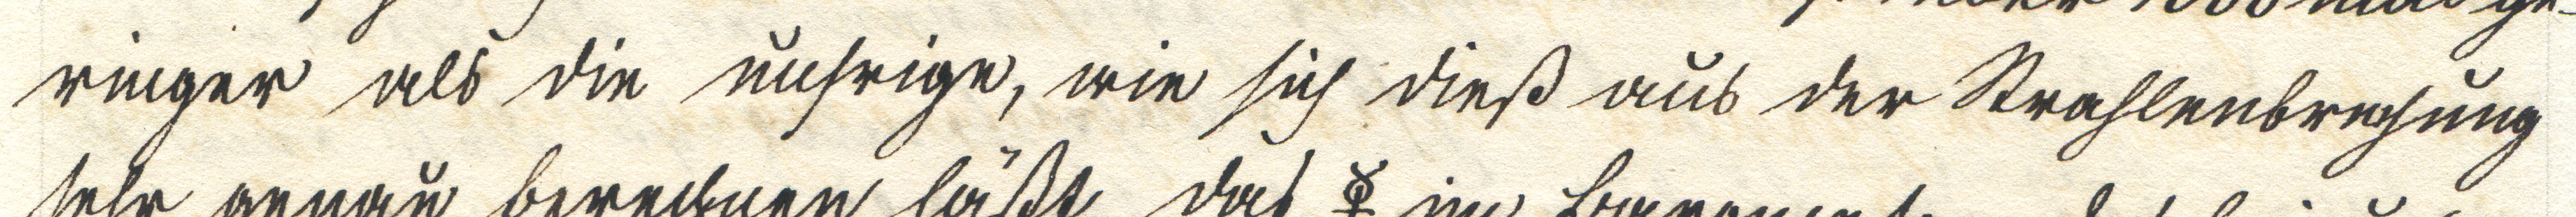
ringer als die unsrige, wie sich dieß aus der Strahlenbrechung
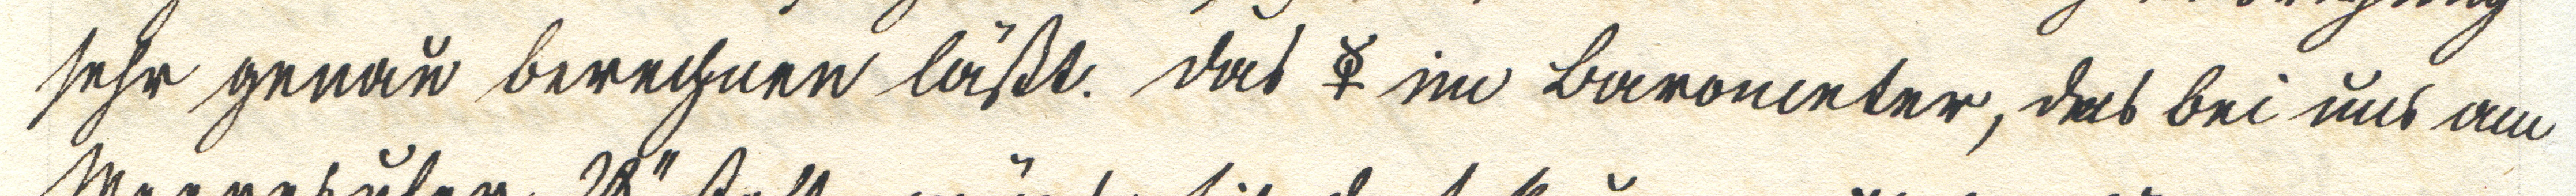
sehr genau berechnen läßt. Das ☿ im Barometer, das bei uns am
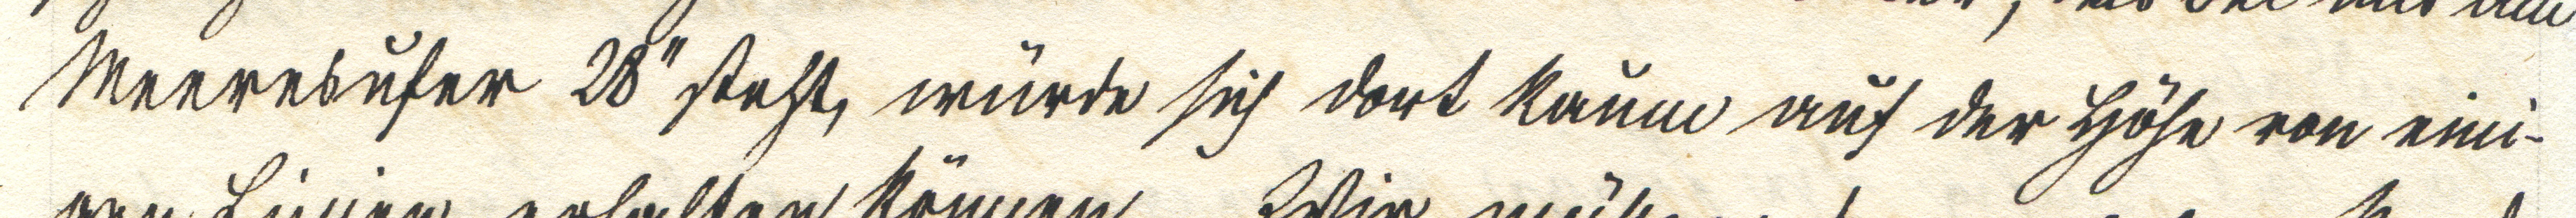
Meeresufer 28″ steht, würde sich dort kaum auf der Höhe von eini-
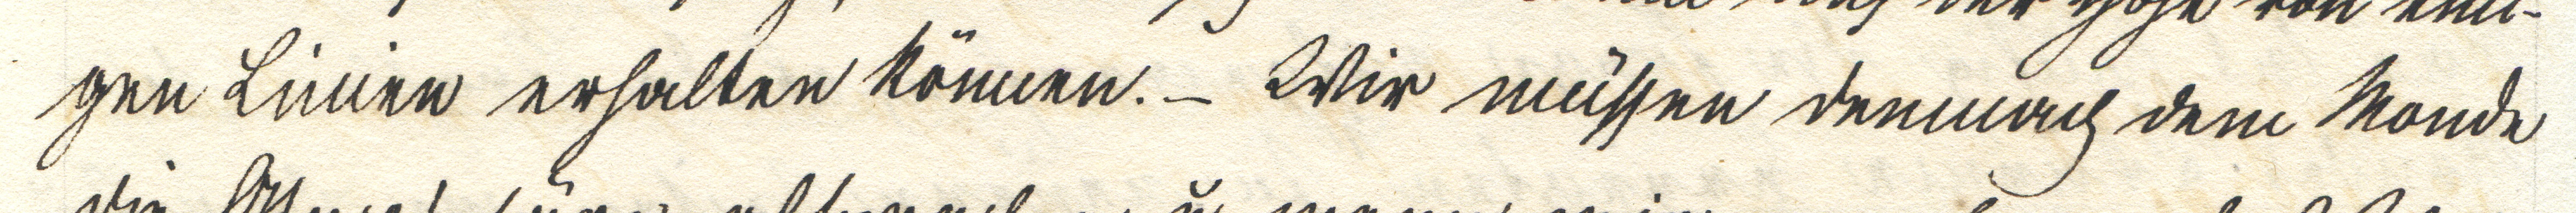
gen Linien erhalten können. – Wir müssen demnach dem Monde
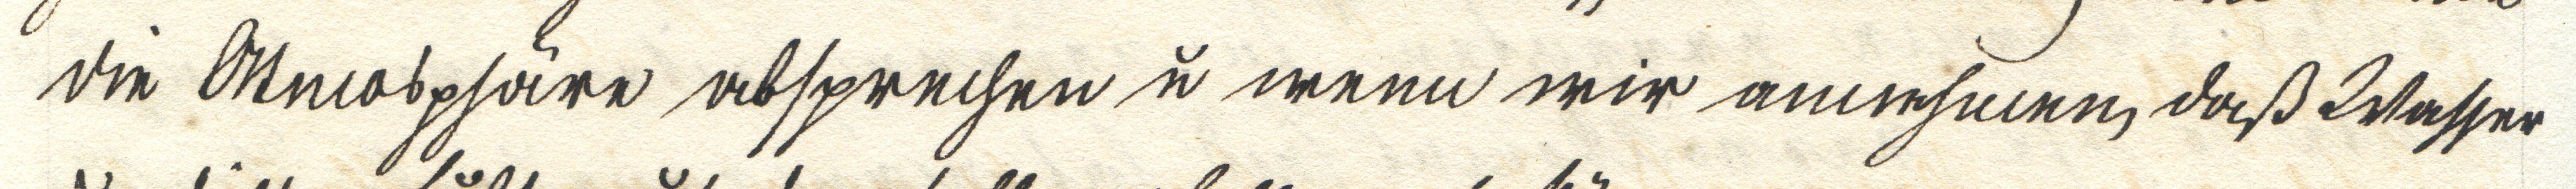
die Atmosphäre absprechen u wenn wir annehmen, daß Wasser
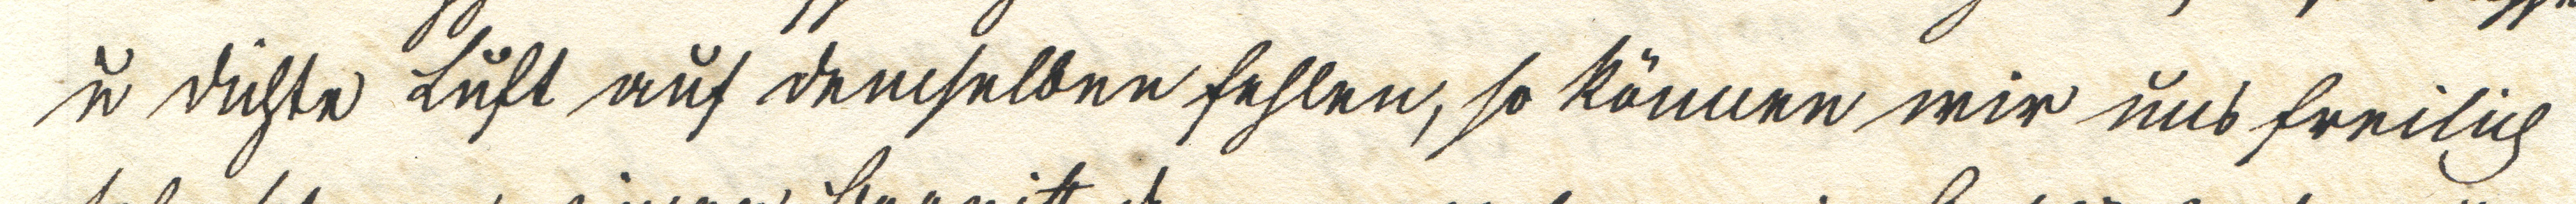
u dichte Luft auf demselben fehlen, so können wir uns freilich
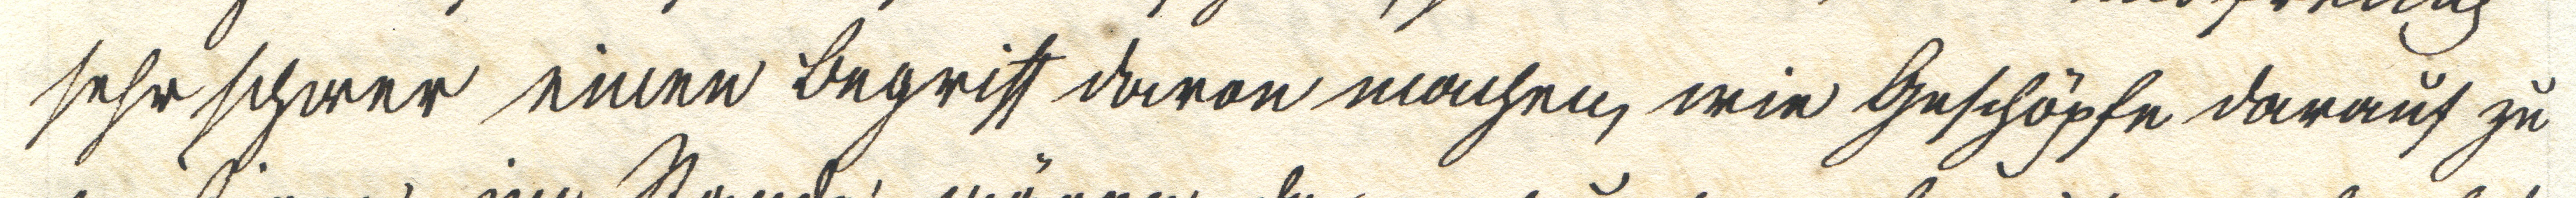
sehr schwer einen Begriff davon machen, wie Geschöpfe darauf zu
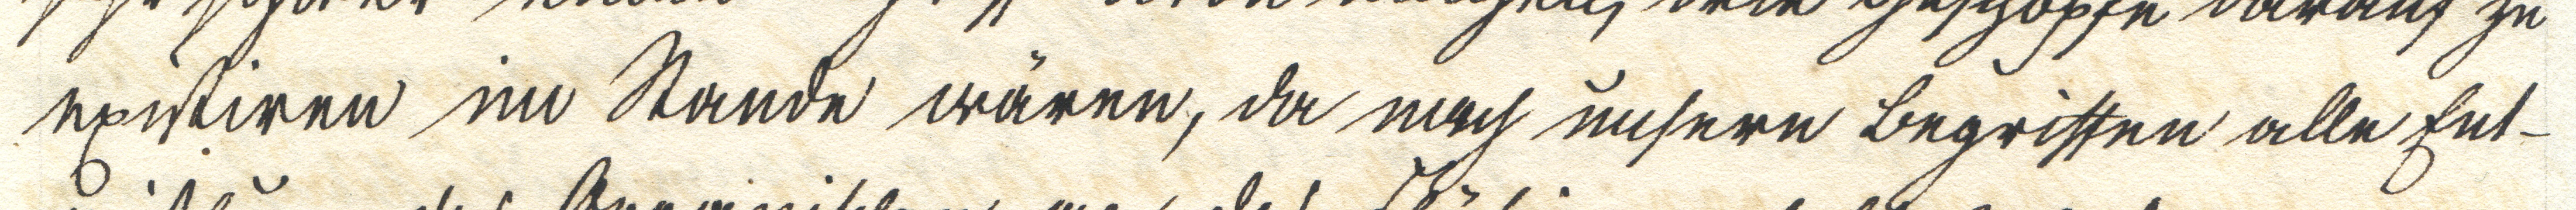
existiren im Stande wären, da nach unsern Begriffen alle Ent-
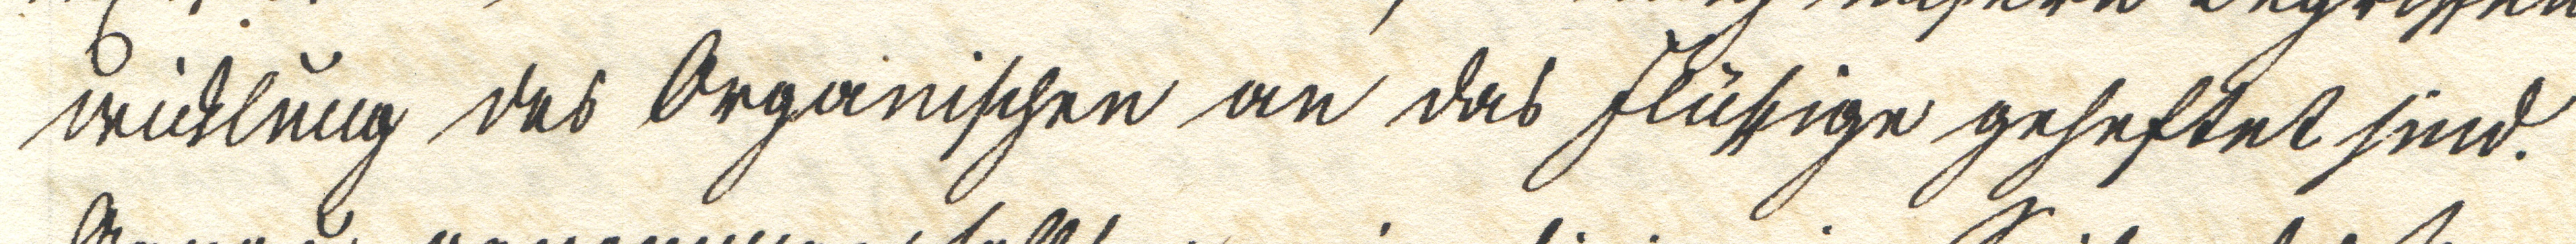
wicklung des Organischen an das Flüssige geheftet sind.
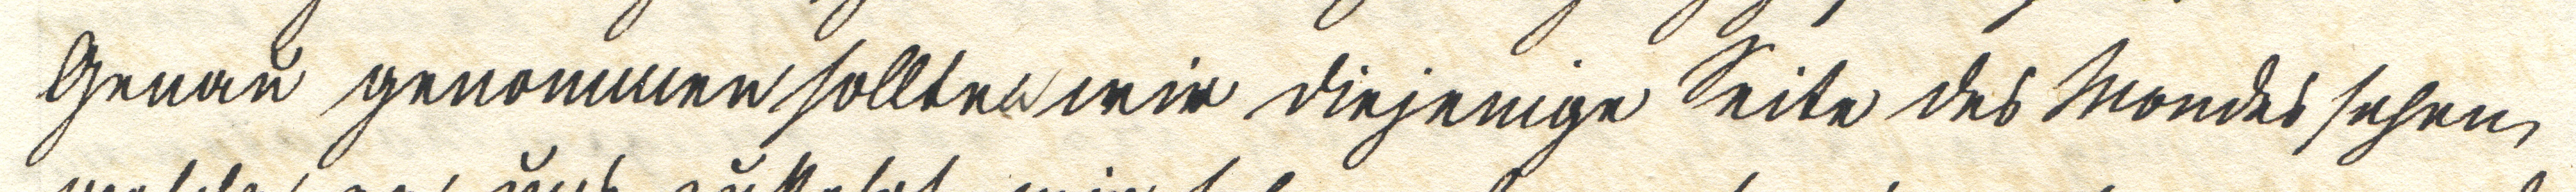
Genau genommen sollten wir diejenige Seite des Mondes sehen,
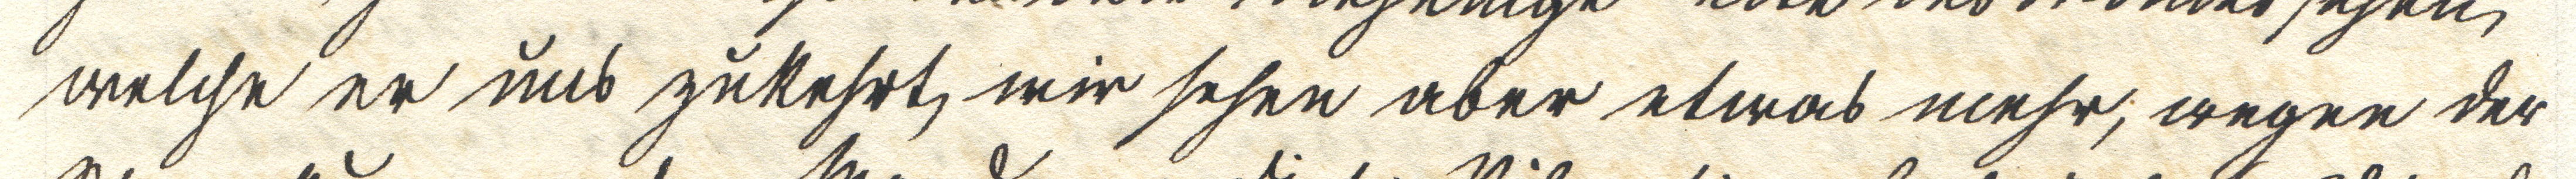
welche er uns zukehrt, wir sehen aber etwas mehr, wegen der
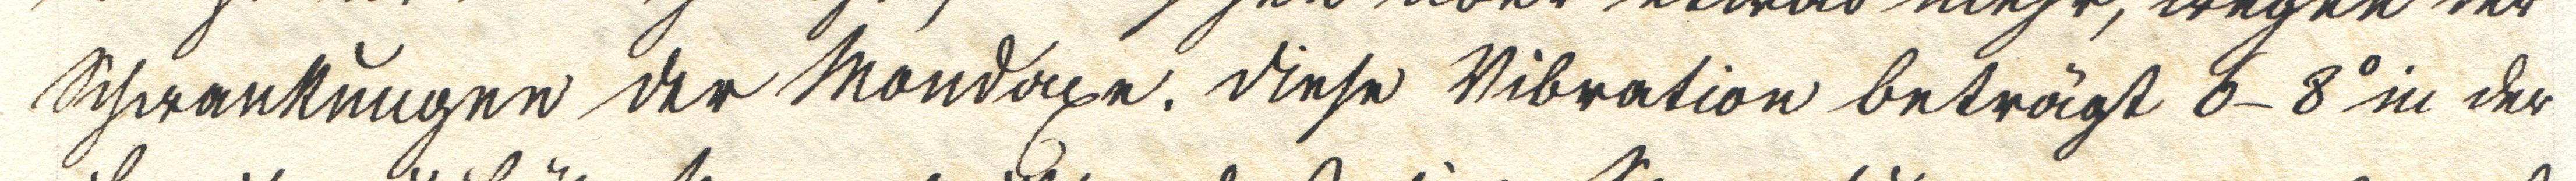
Schwankungen der Mondaxe. Diese Vibration beträgt 6–8° in der
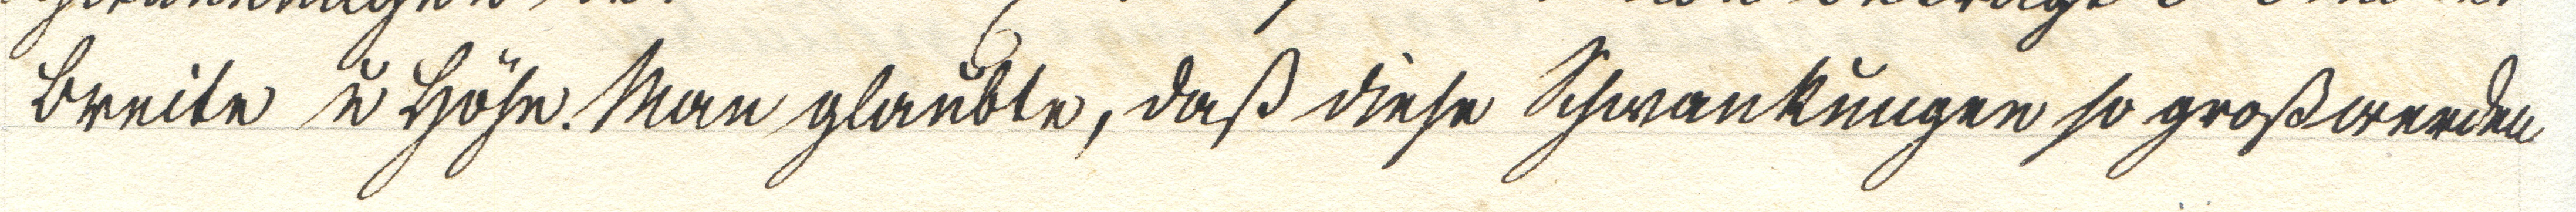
Breite u Höhe. Man glaubte, daß diese Schwankungen so groß werden
